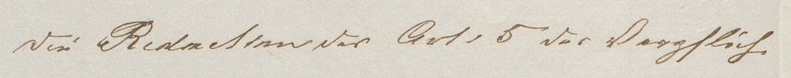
Die Redaction des Art. 5 des Verpflich-
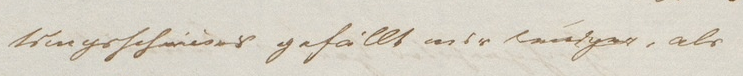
tungsscheines gefällt mir weniger, als
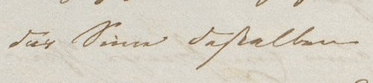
der Sinn deßelben.
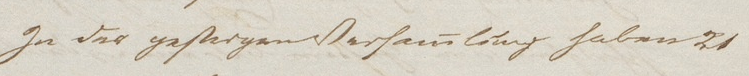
In der gestrigen Versammlung haben 21
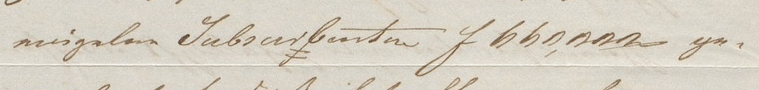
einzelne Subscribenten f 660,000 ge-
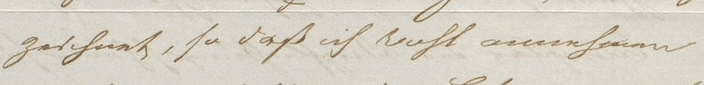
zeichnet, so daß ich wohl annehmen
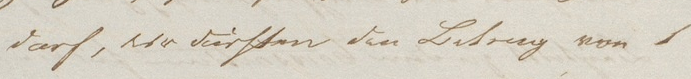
darf, wir dürften den Betrag von 1
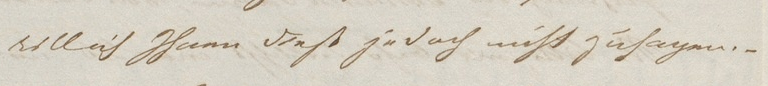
will ich Ihnen dieß jedoch nicht zusagen. –
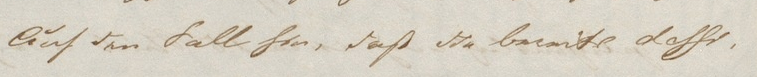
Auf den Fall hin, daß die bereits deffi-
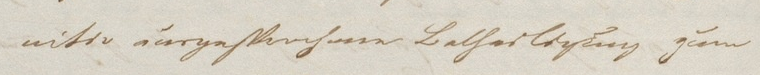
nitiv ausgesprochene Betheiligung zum
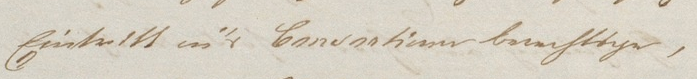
Eintritt in's Consortium berechtige,
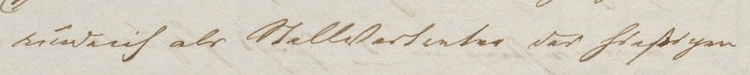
wurde ich als Stellvertreter des hießigen
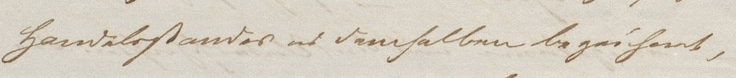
Handelsstandes in demselben bezeichnet,
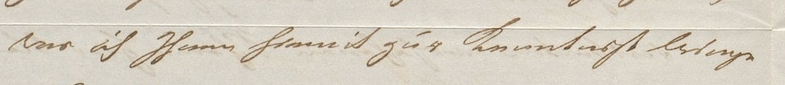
was ich Ihnen hiemit zur Kenntniß bringe.
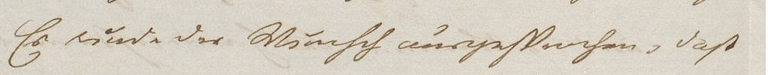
Es wurde der Wunsch ausgesprochen, daß
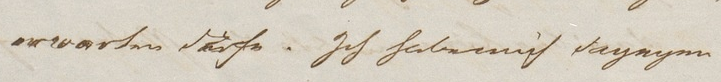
erwarten dürfe. Ich habe mich dagegen
